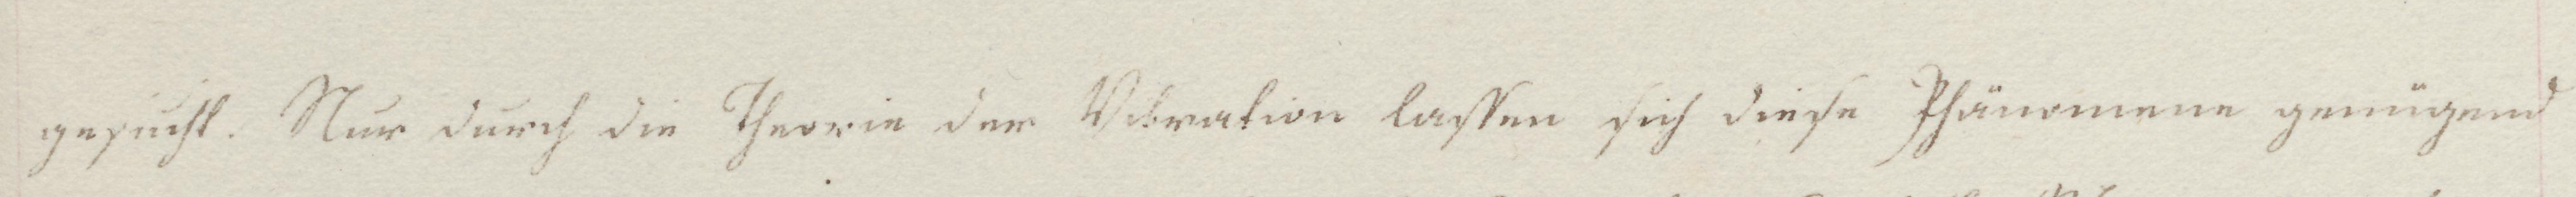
gesucht. Nur durch die Theorie der Vibration lassen sich diese Phänomene genügend
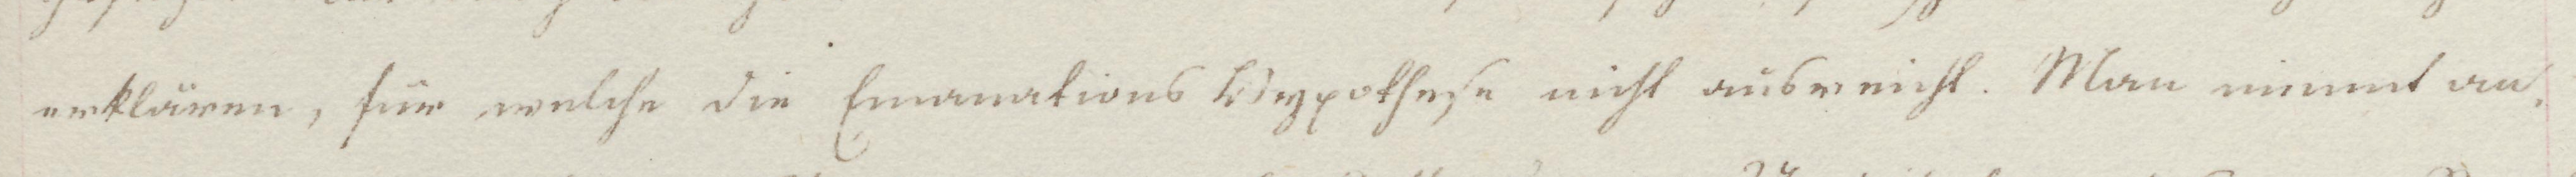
erklären, für welche die Emanations Hypothese nicht ausreicht. Man nimmt an,
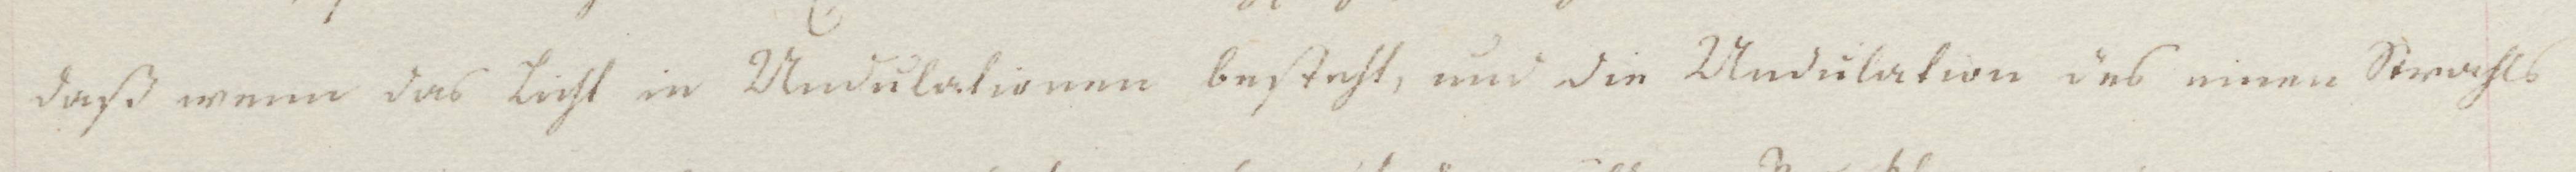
daß wenn das Licht in Undulationen besteht, und die Undulation des einen Strahls
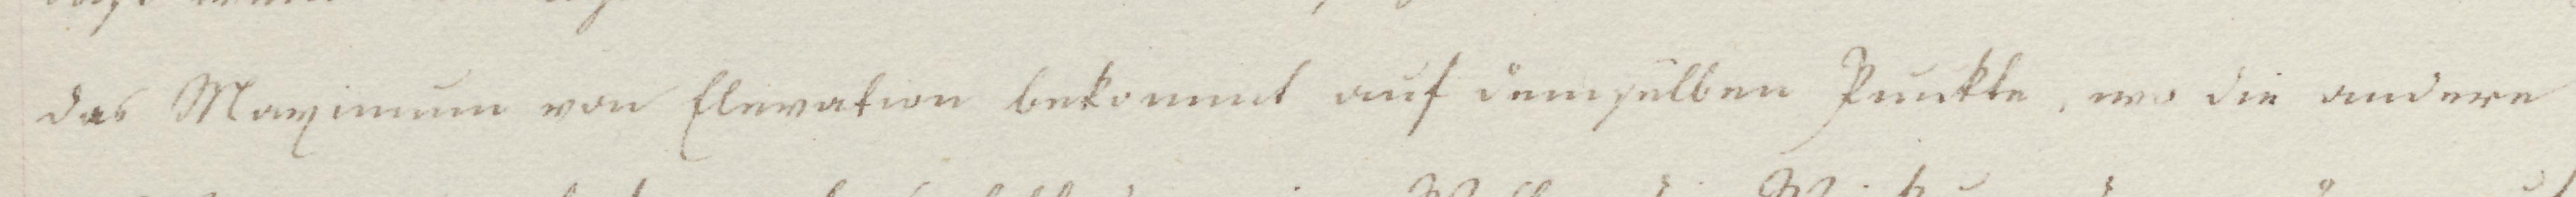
das Maximum von Elevation bekommt auf demselben Punkte, wo die andere
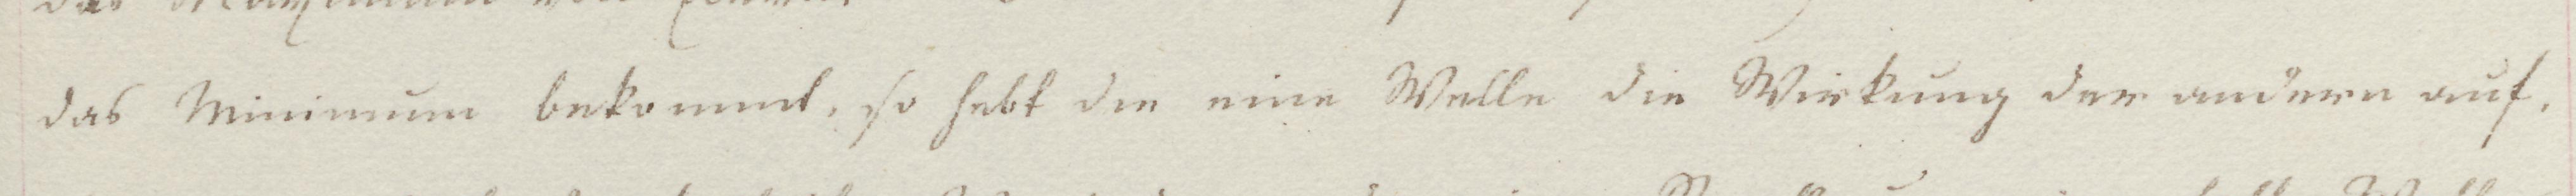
das Minimum bekommt, so hebt die eine Welle die Wirkung der andern auf,
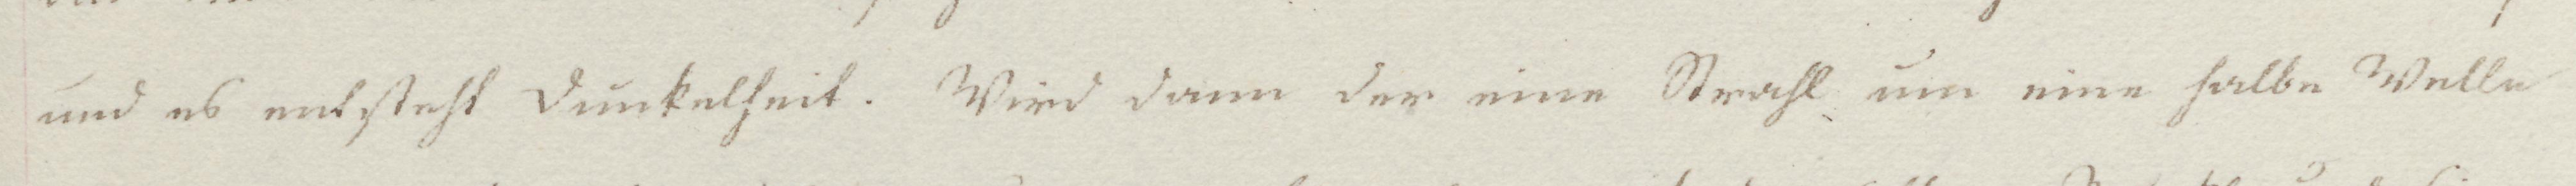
und es entsteht Dunkelheit. Wird dann der eine Strahl um eine halbe Welle
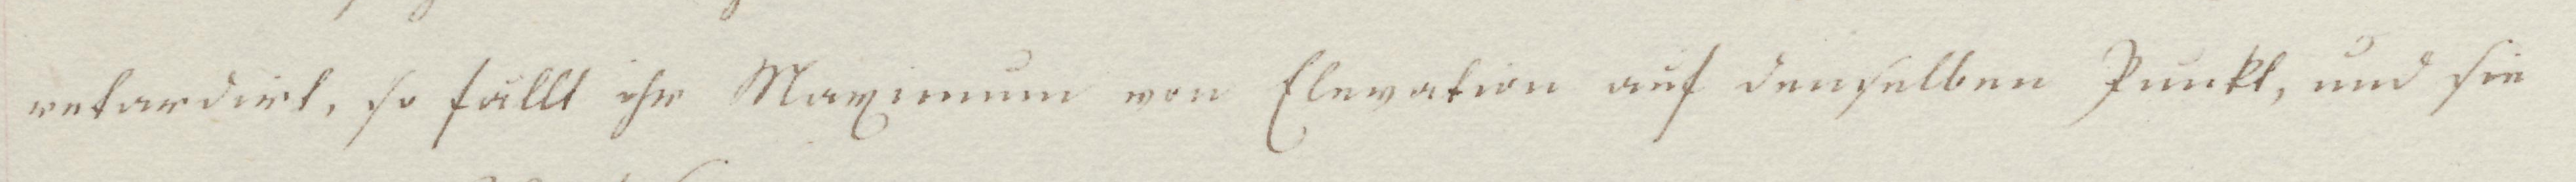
retardirt, so fällt ihr Maximum von Elevation auf denselben Punkt, und sie
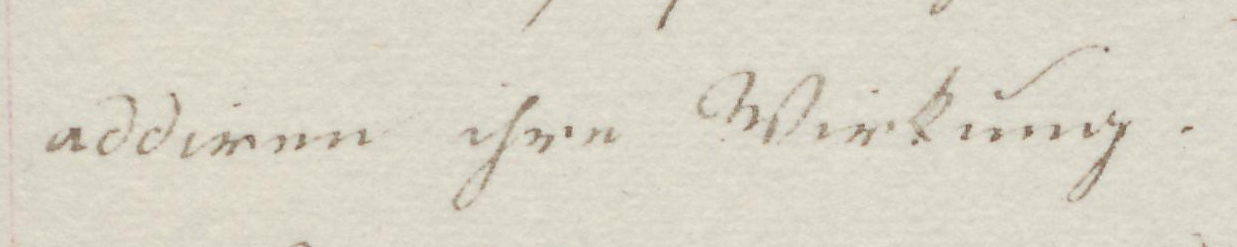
addiren ihre Wirkung.
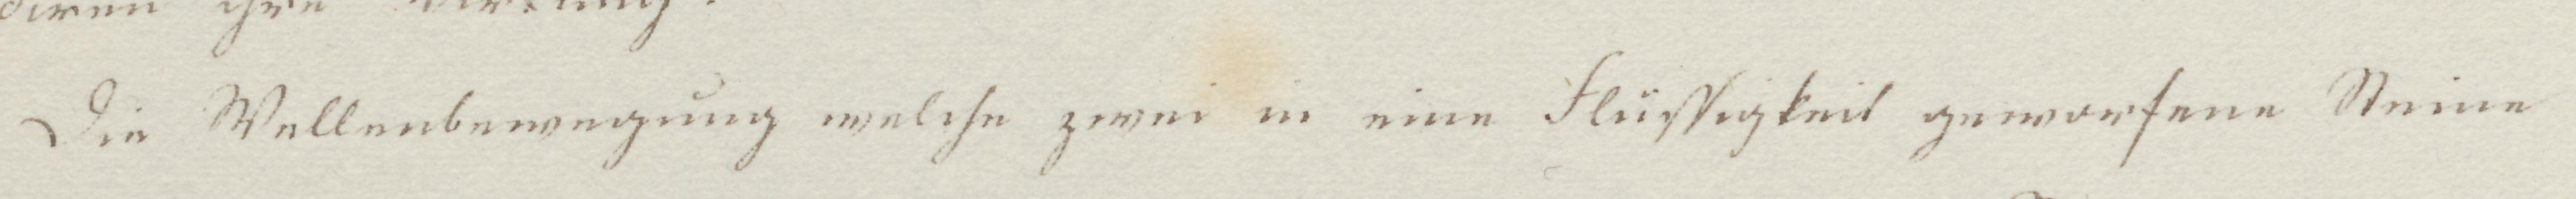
Die Wellenbewegung welche zwei in eine Flüssigkeit geworfene Steine
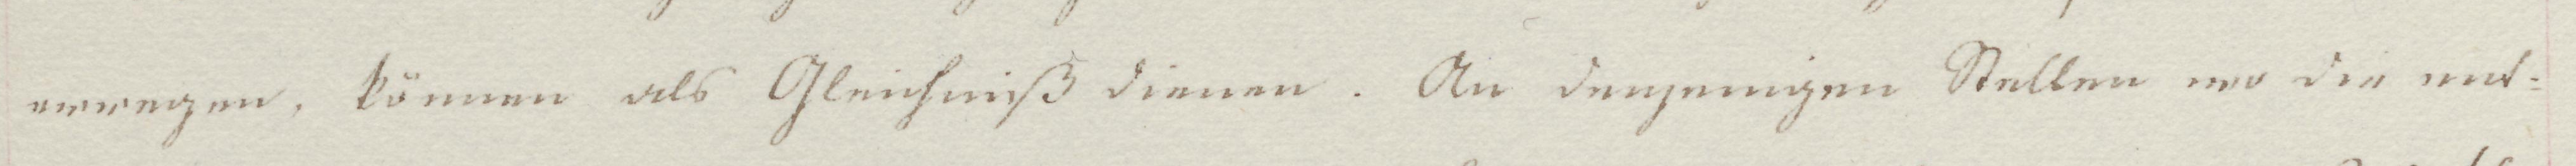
erregen, als Gleichniß dienen. An denjenigen Stellen wo die ent-
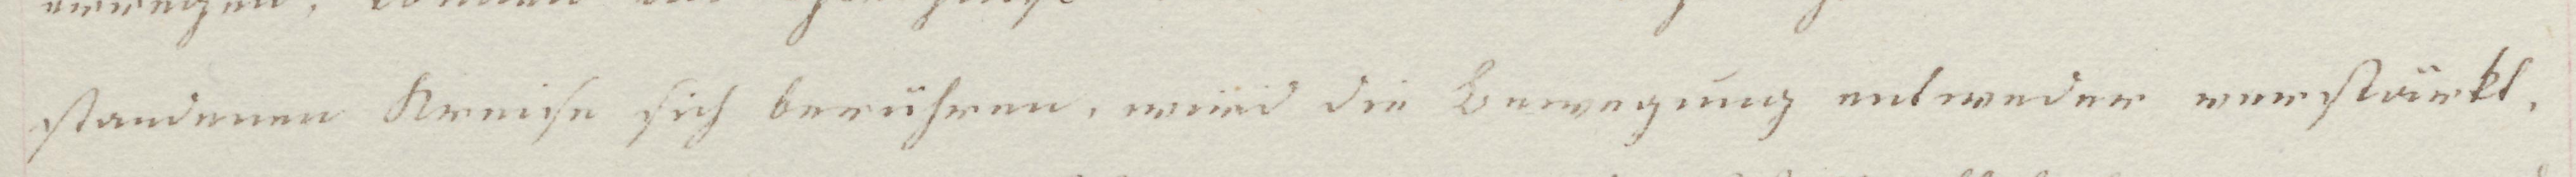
standenen Kreise sich berühren, wird die Bewegung entweder verstärkt,
